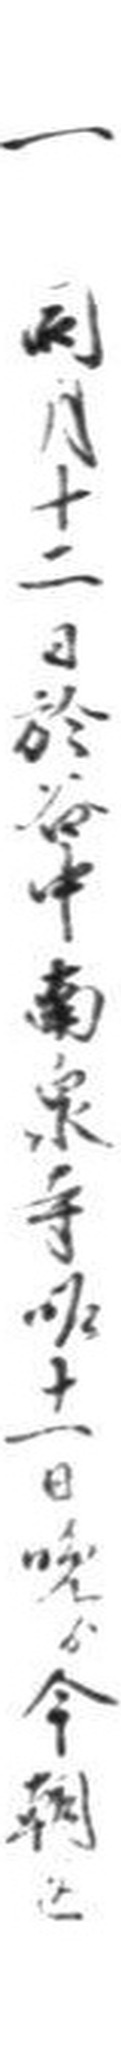一同月十二日於谷中南泉寺昨十一日晩ゟ今朝迄
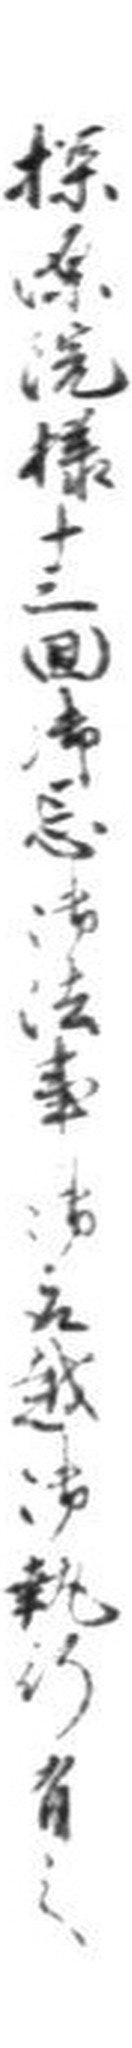探源院様十三回御忌御法事御取越御執行有之
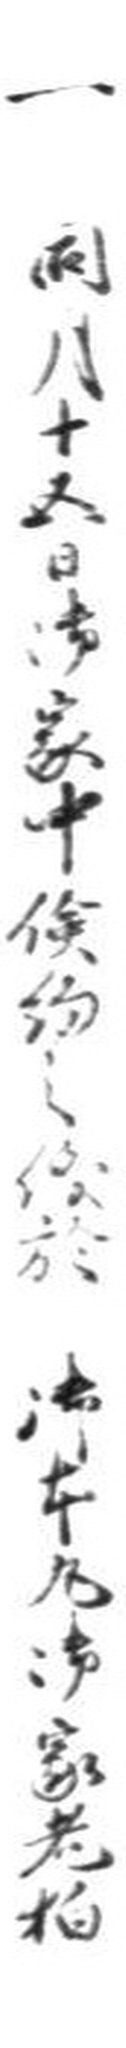一同月十五日御家中倹約之儀於御本丸御家老狛
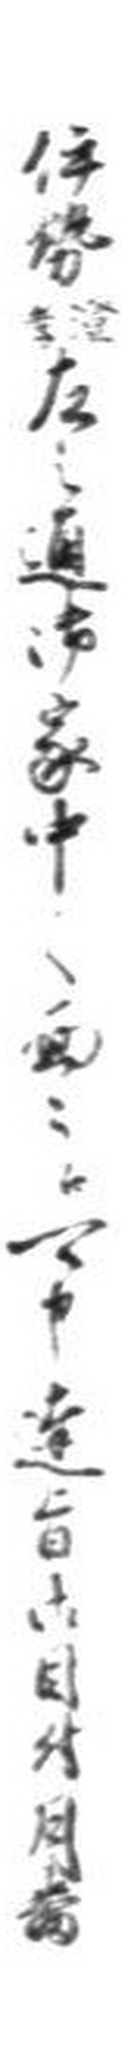孝左之通御家中之面々江可申達旨御目付月番
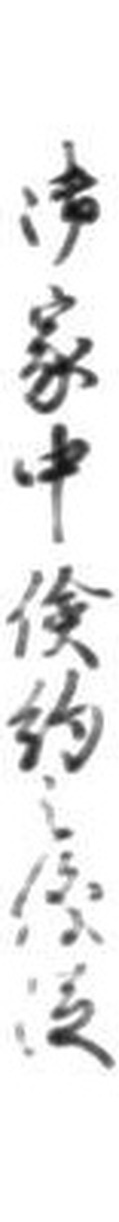御家中倹約之儀従
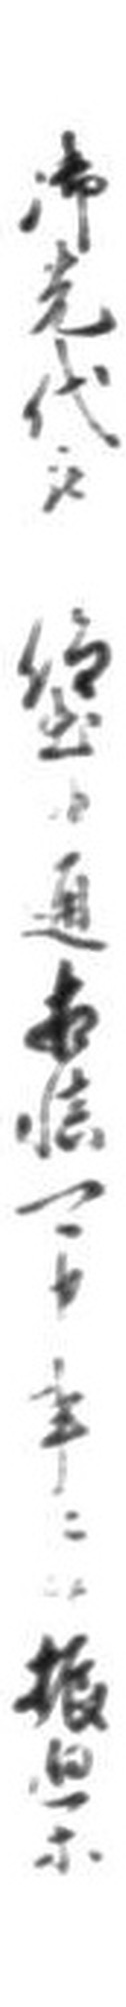御先代被仰出候通相慎可申事ニ候振廻等
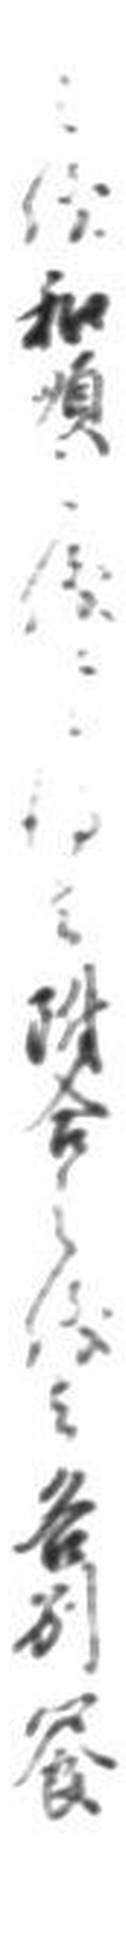之儀和順之儀ニ候得者付合之儀者各別饗
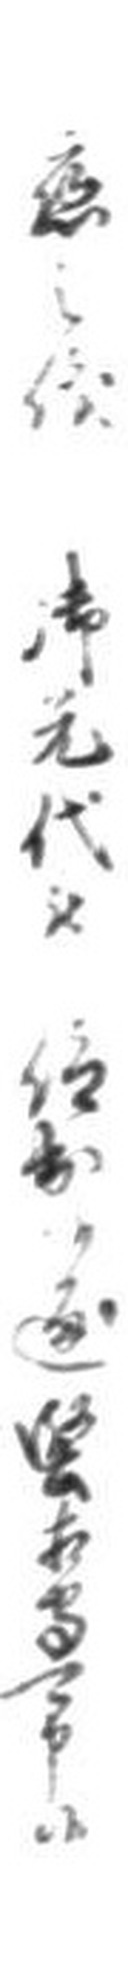応之儀御先代被仰出候通堅相守可申候
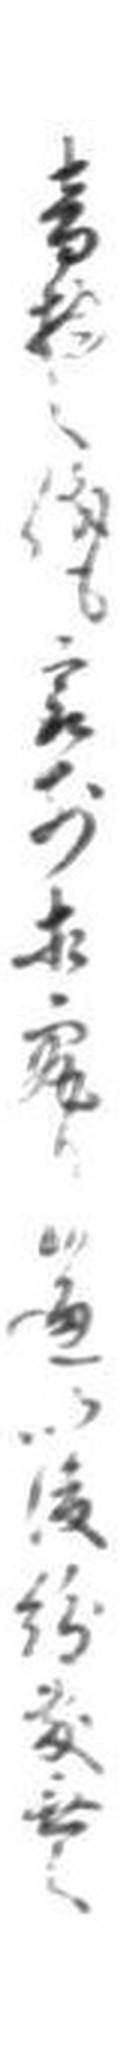音物之儀も最前相究り候通以後紛敷無之
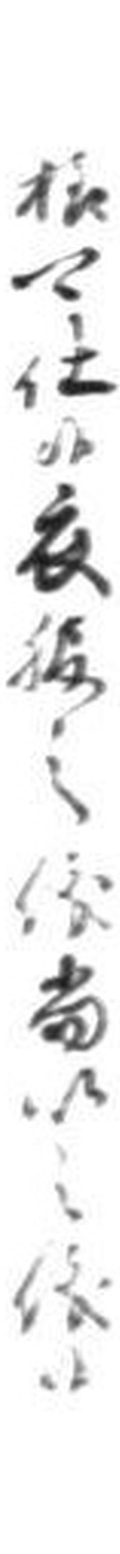様可仕候衣服之儀尚以之儀候
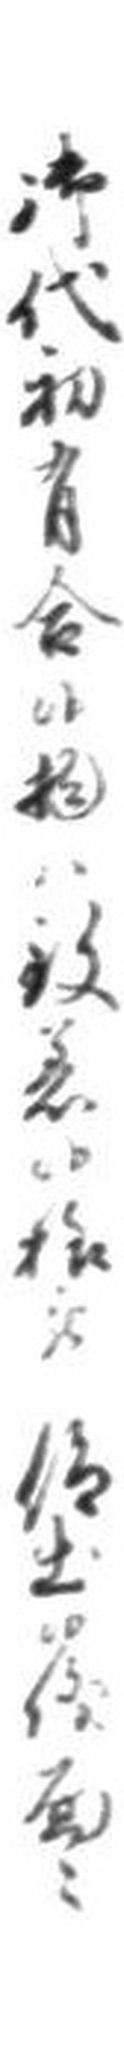御代初有合候物ハ致着候様被仰出候儀面々

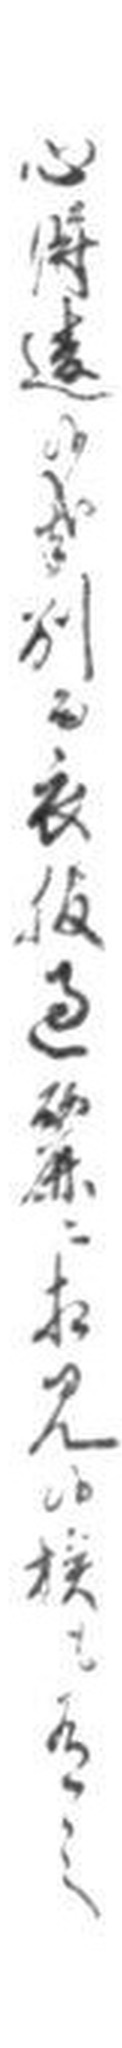心得違候哉別而衣服過麗ニ相見候様も有之
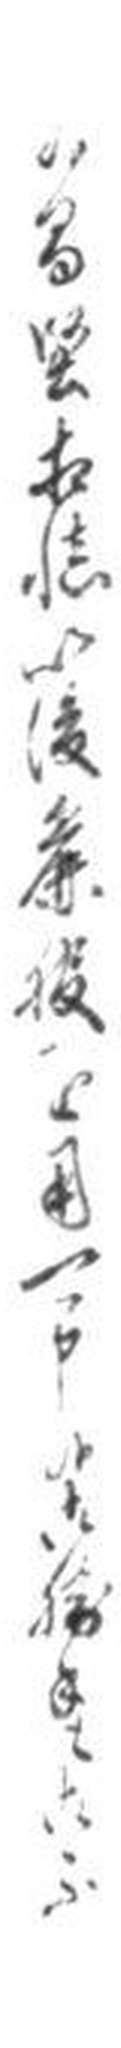候間堅相慎以後麁服を用可申候御勝手も御不
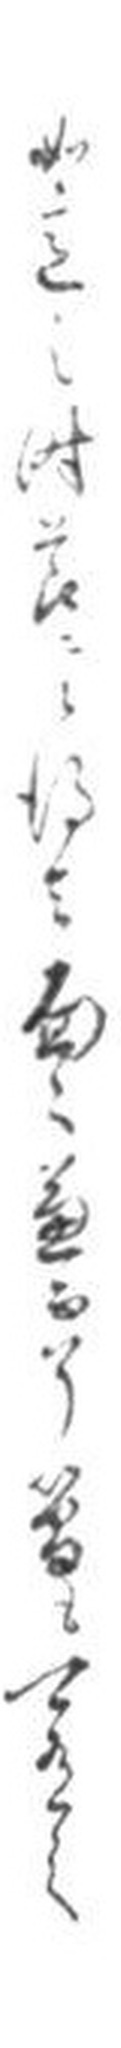如意之時節ニ候得者面々兼而了簡も可有之
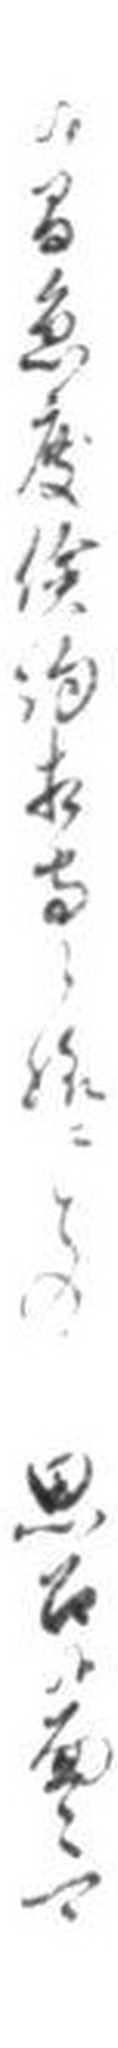候間急度倹約相守候様ニとの思召候面々可
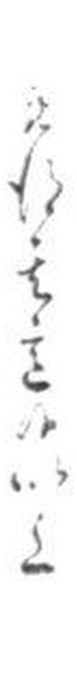被得其意候以上
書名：家譜 三十六 宗昌公 従享保八年到同九年
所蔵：福井県文書館 Fukui Prefectural Archives
